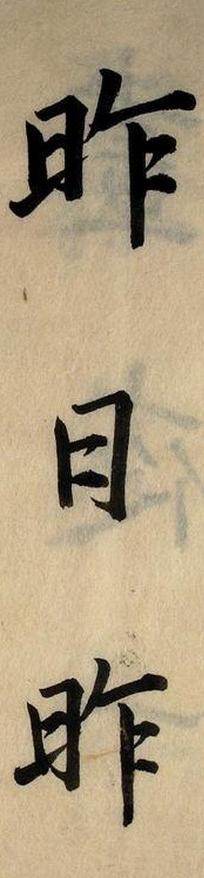昨日昨
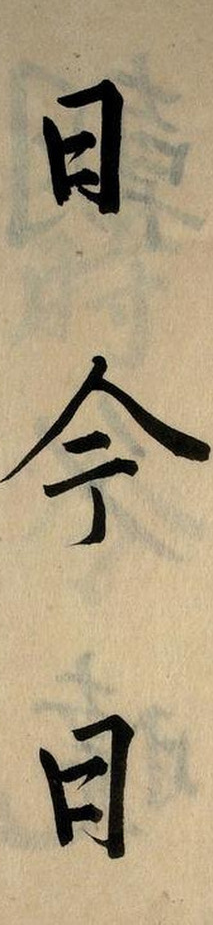日今日
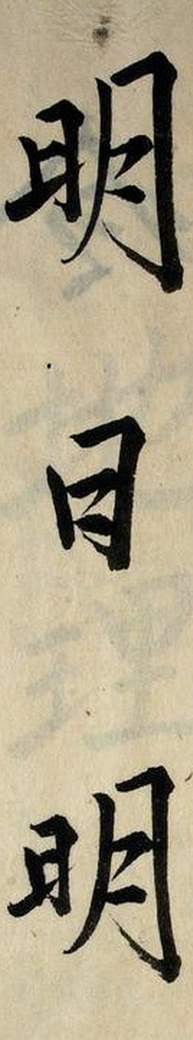明日明
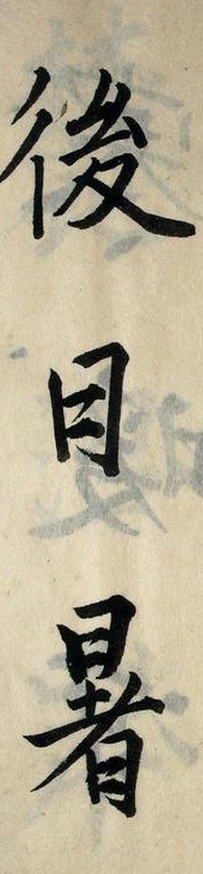後日暑

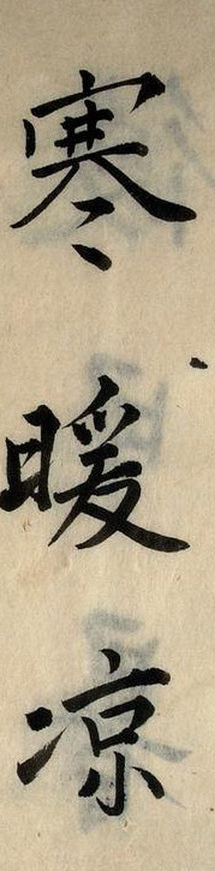寒暖涼
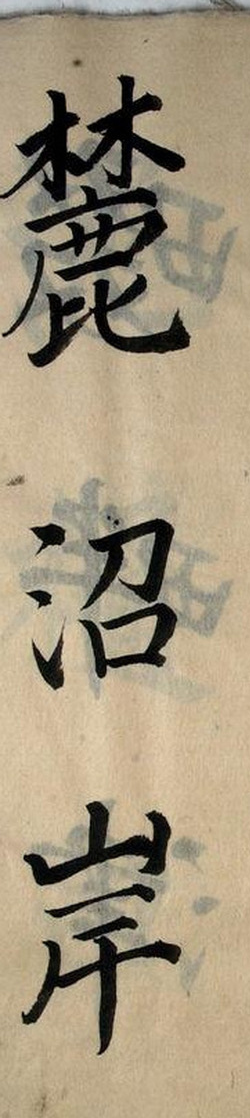麓沼岸

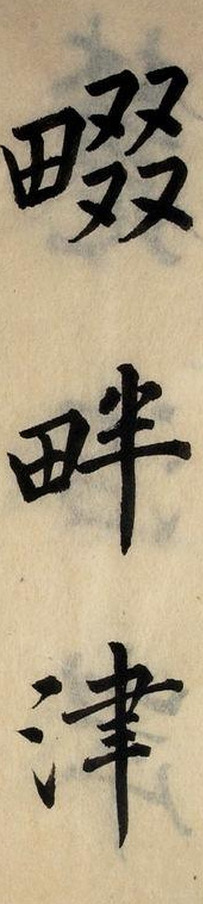畷畔津
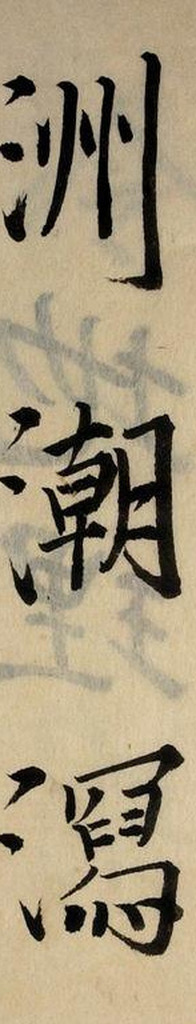洲潮潟
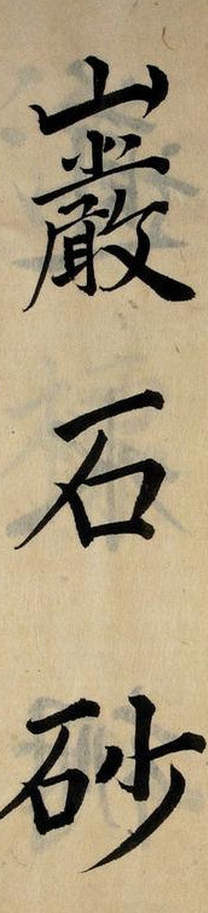巌石砂
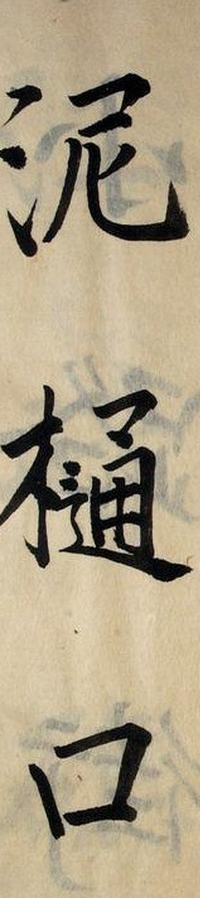泥樋口

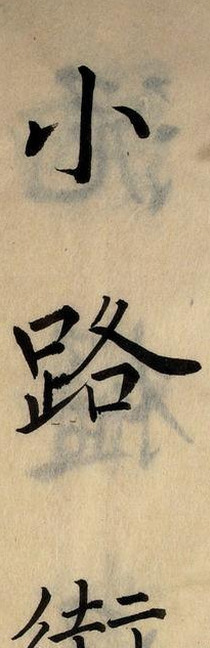小路街
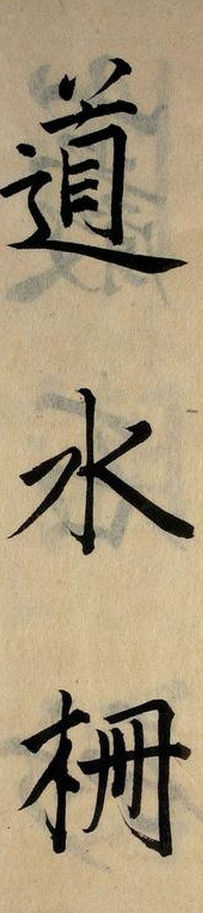道水柵
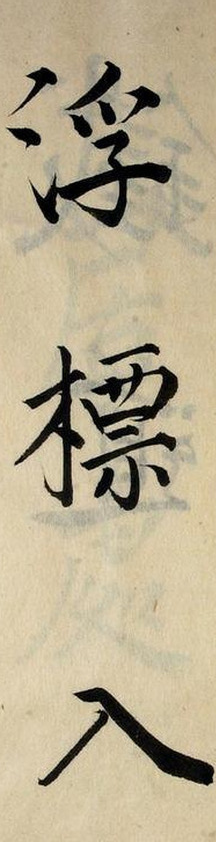浮標入
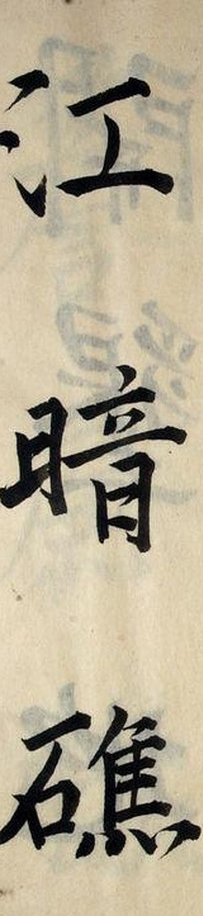江暗礁

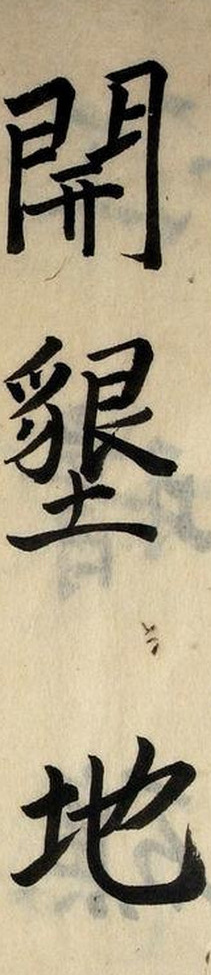開墾地

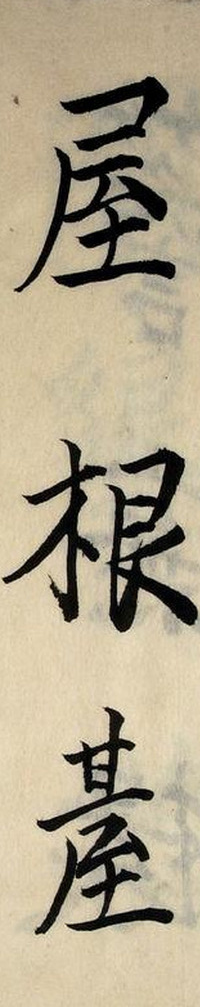屋根臺
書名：御手本（手習）
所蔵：福井県文書館 Fukui Prefectural Archives
